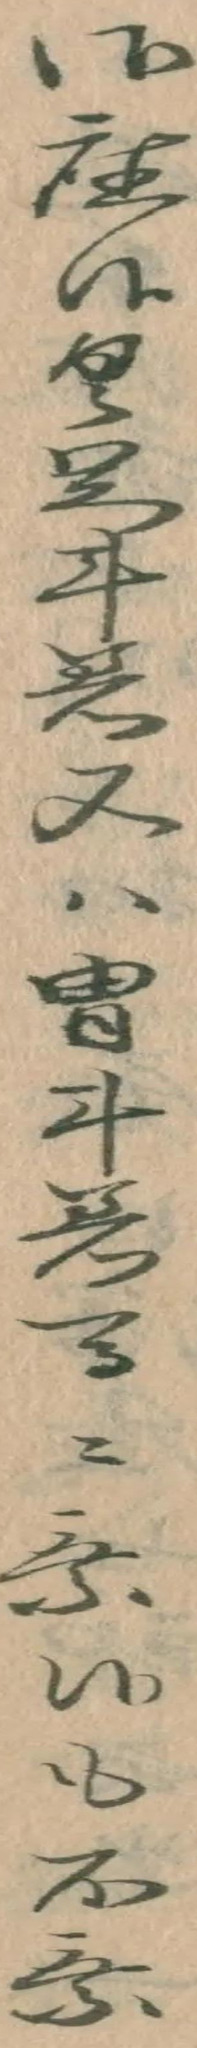御座候具足斗着又は冑斗着馬に乗候も不乗
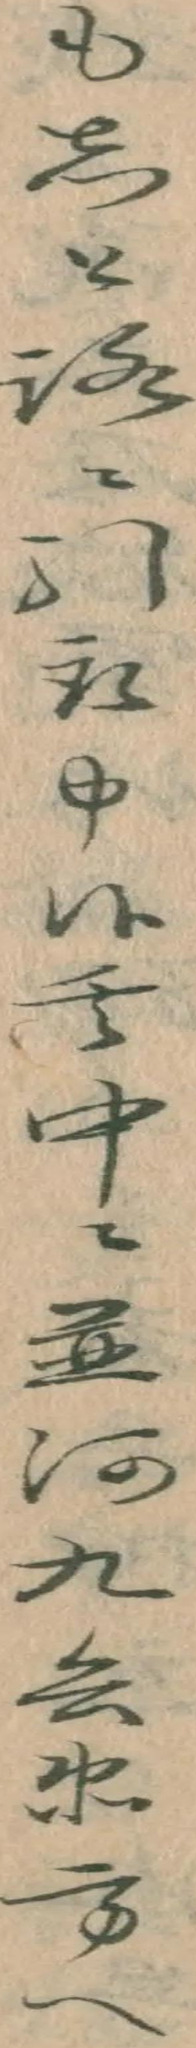も志と路に引取申候其中に並河九兵衛方へ
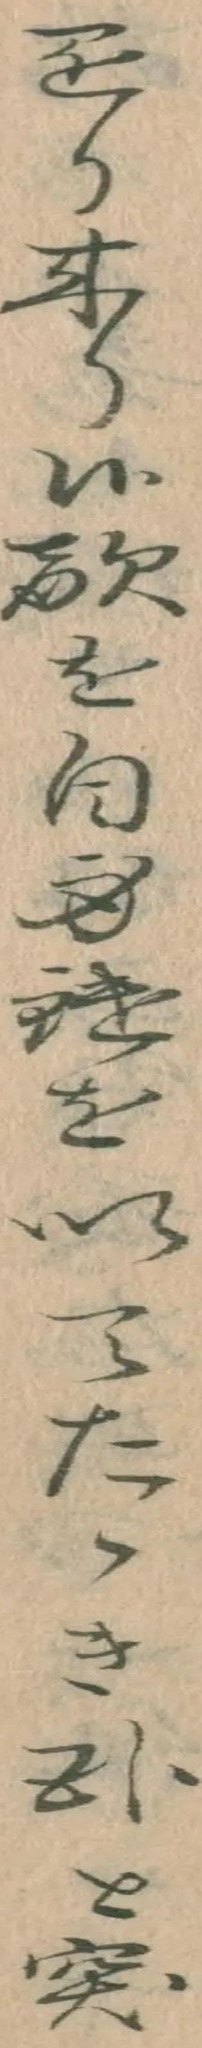懸り来り候敵を自身鑓を以てたゝき臥と突
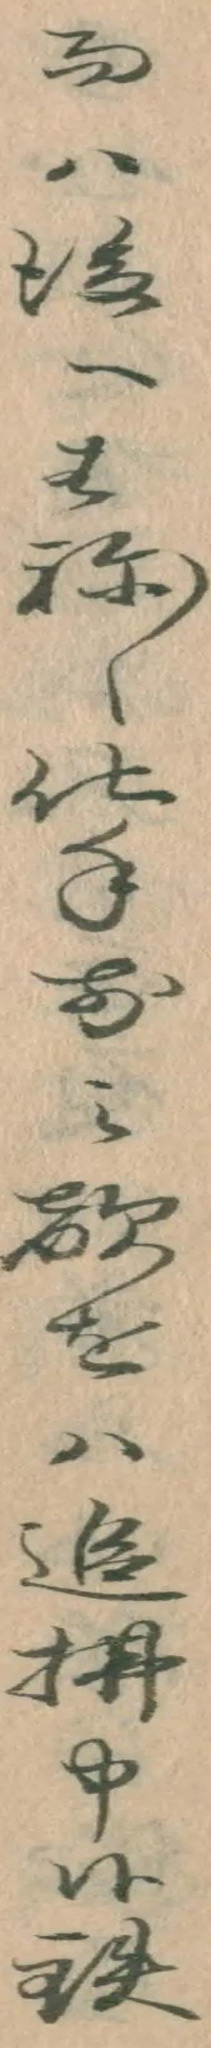而は後へ者称し仕手前之敵をは追払申候鉄
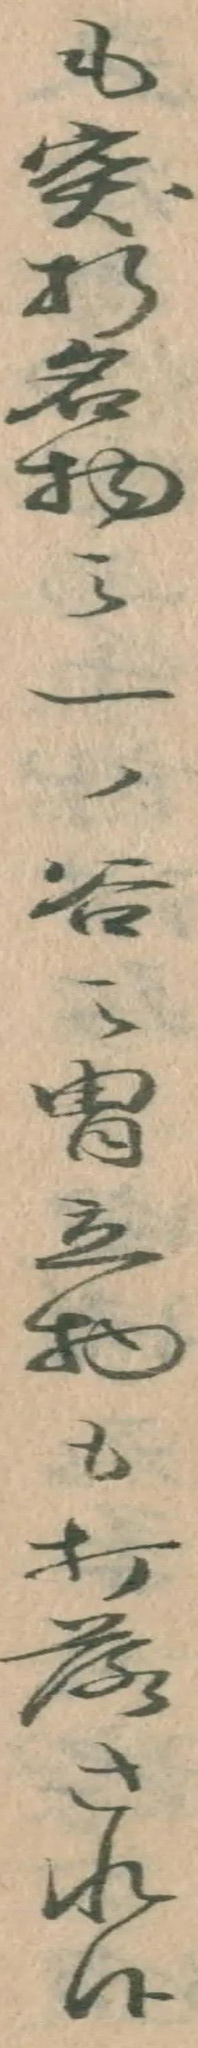も突折名物之一之谷之冑立物も打落され候
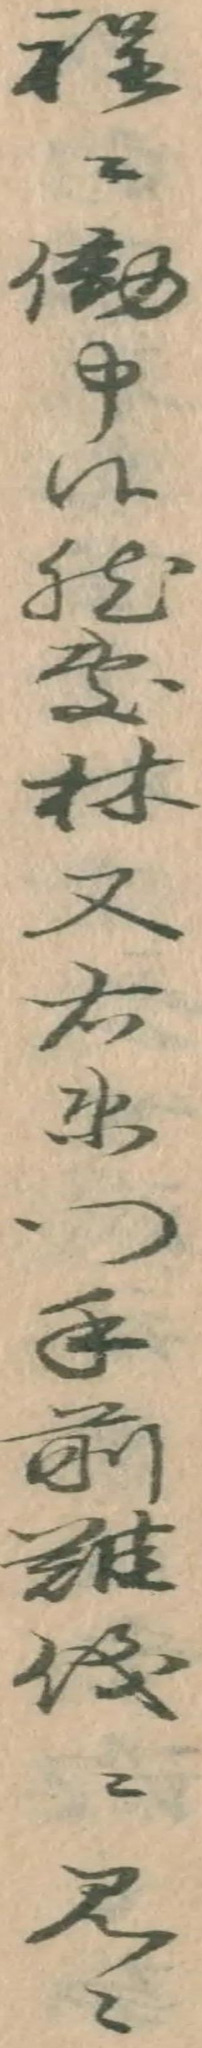程に働申候然處林又右衛門手前難儀に見に
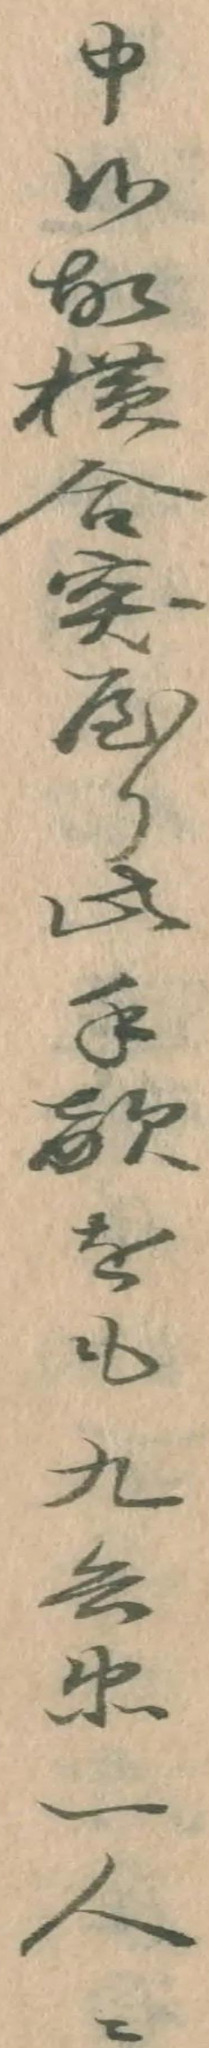申候故横合突屋り此手敵をも九兵衛一人に

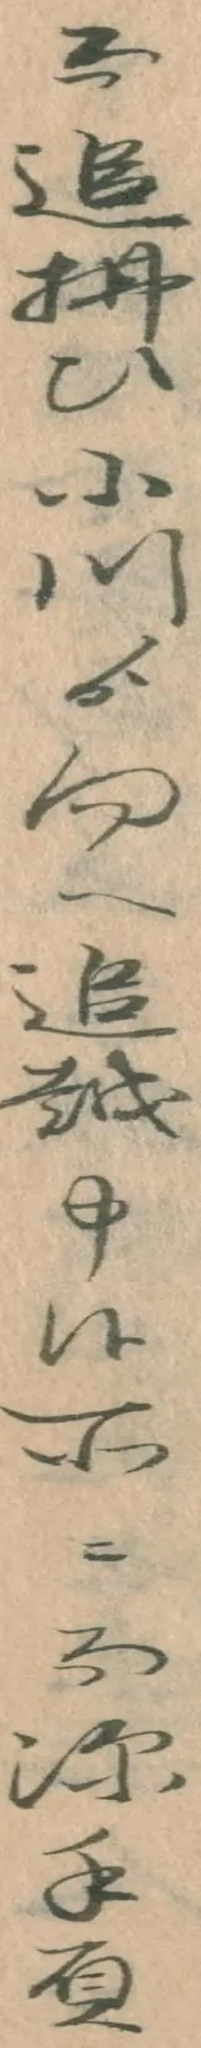而追払ひ小川ゟ向へ追越申候所に而深手負
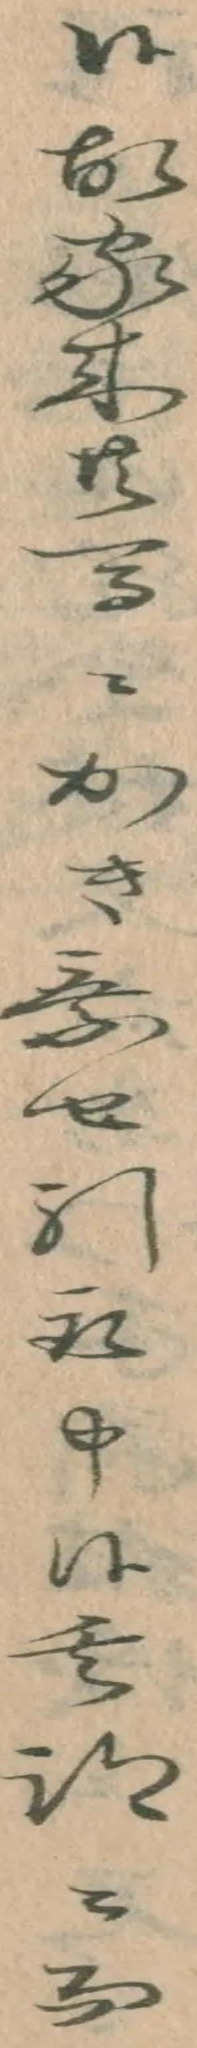候故家来共馬にかき乗せ引取申候其跡に而
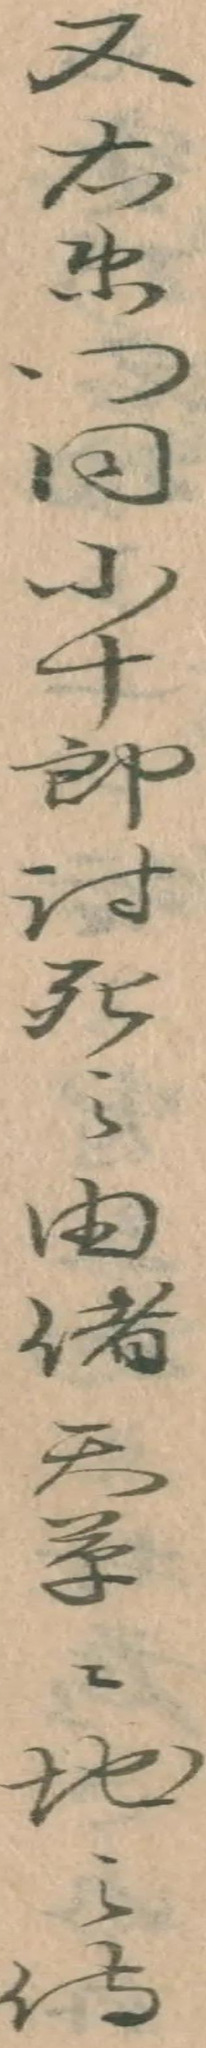又右衛門同小十郎討死之由偖天草に地之侍
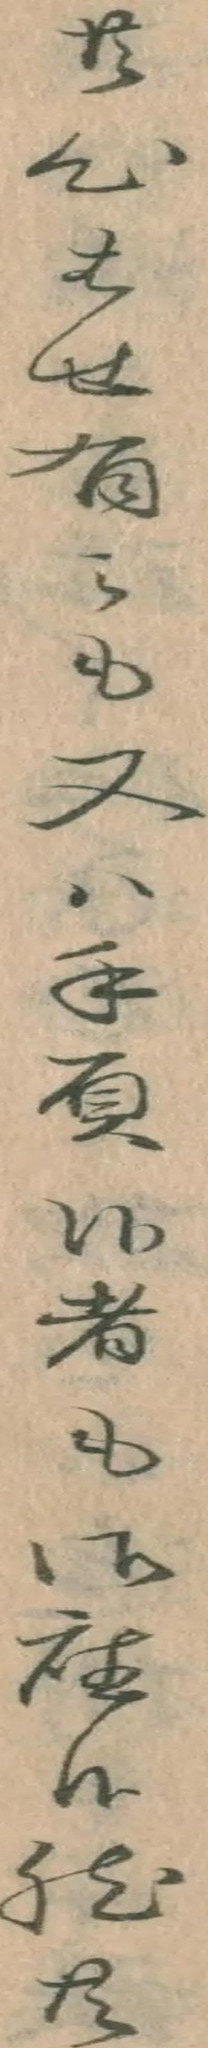共心はせ有之も又は手負候者も御座候然共
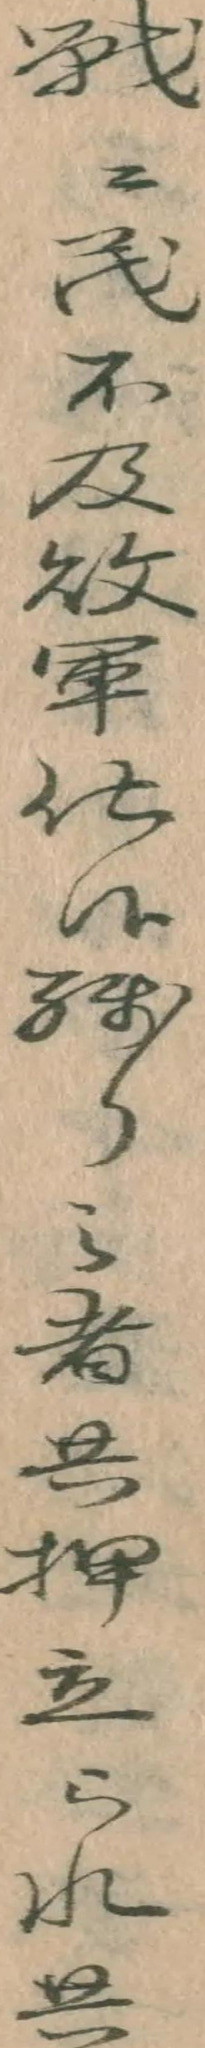戦に茂不及敗軍仕候残り之者共押立られ共
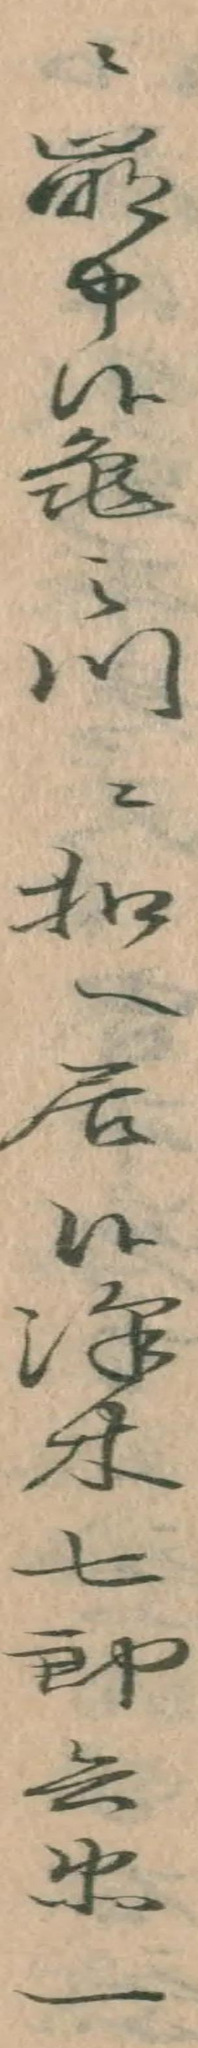に崩申候亀之川に扣へ居候沢木七郎兵衛一
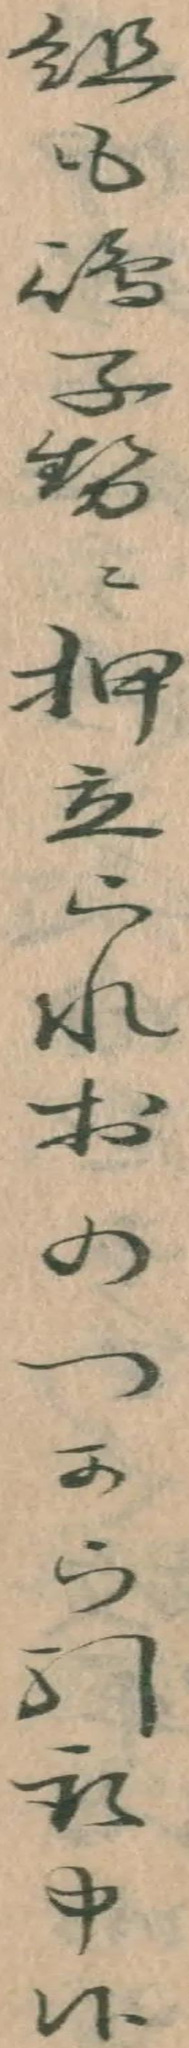組も島子勢に押立られおのつから引取申候
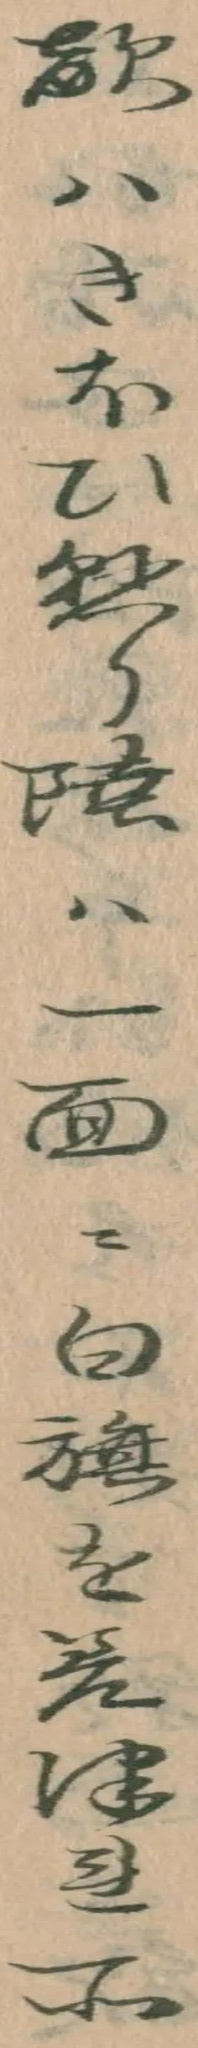敵はきほひ懸り陸は一面に白旗を差津連所
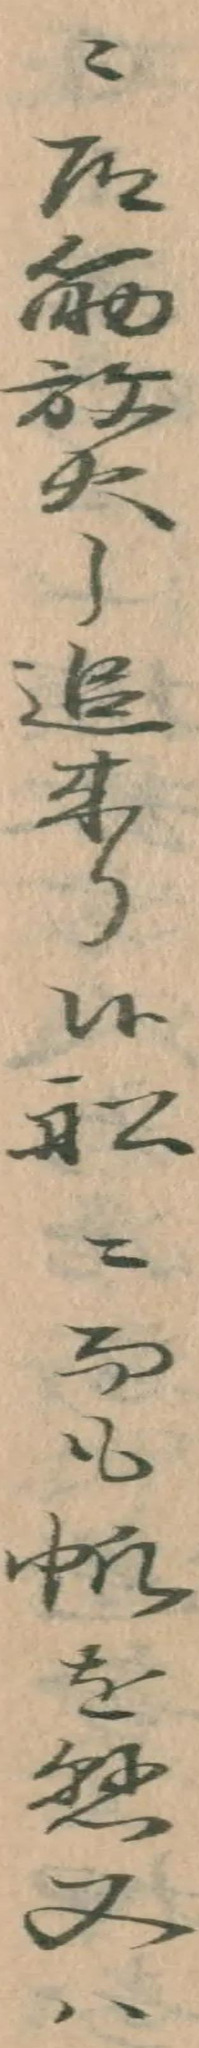に道筋放火し追来り候舩に而も帆を懸又は
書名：切支丹御退治記 49巻. [2]
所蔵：国立国会図書館 National Diet Library, JAPAN
